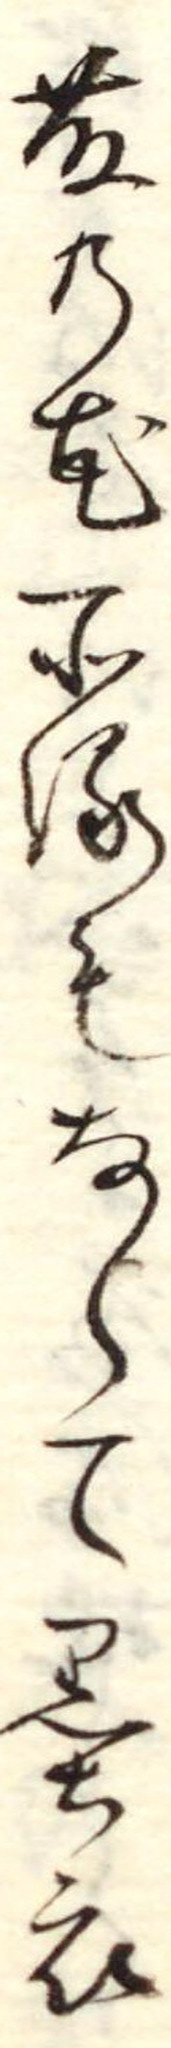藤の花所縁もならて墨衣
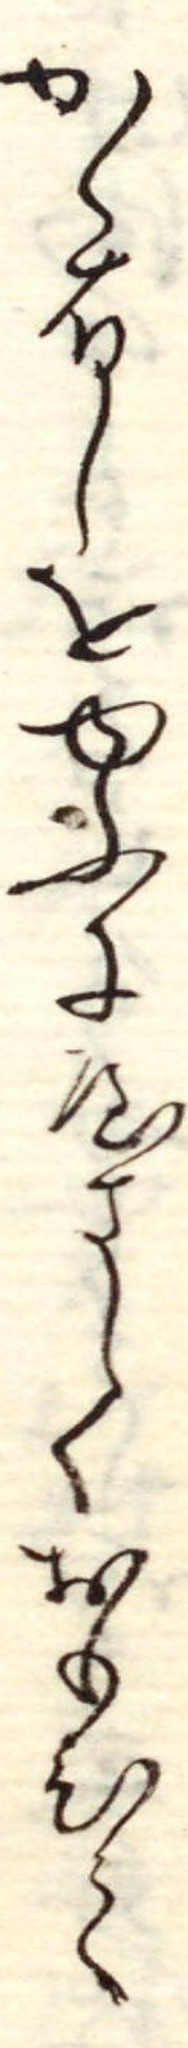かゝ有しをゆふにやさしくおもひて
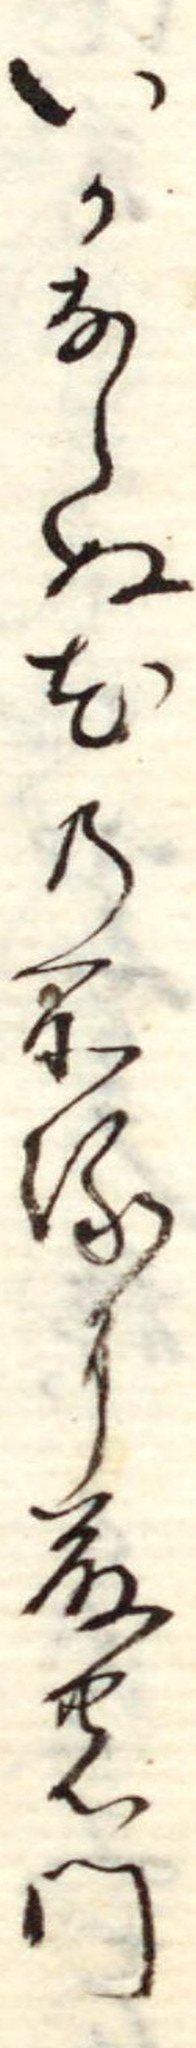いかならぬ花の所縁に藤の門
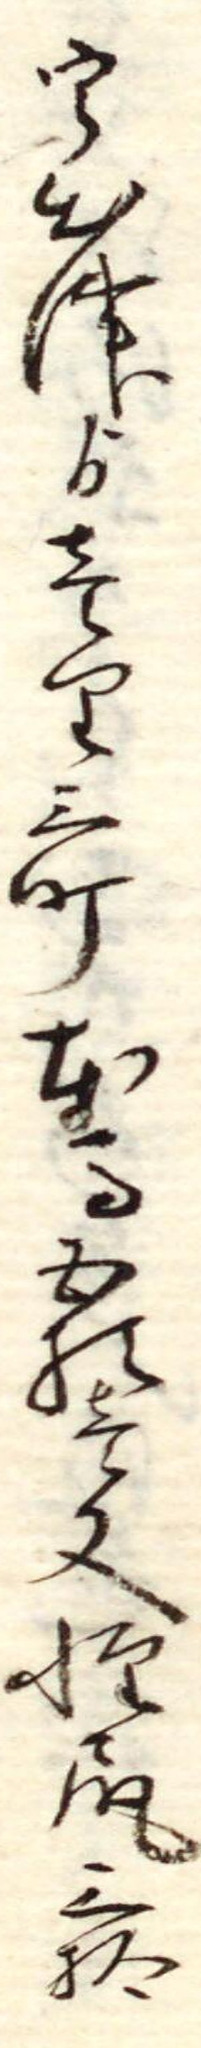宇出津ゟ壱里三町本馬五拾壱文軽尻三拾
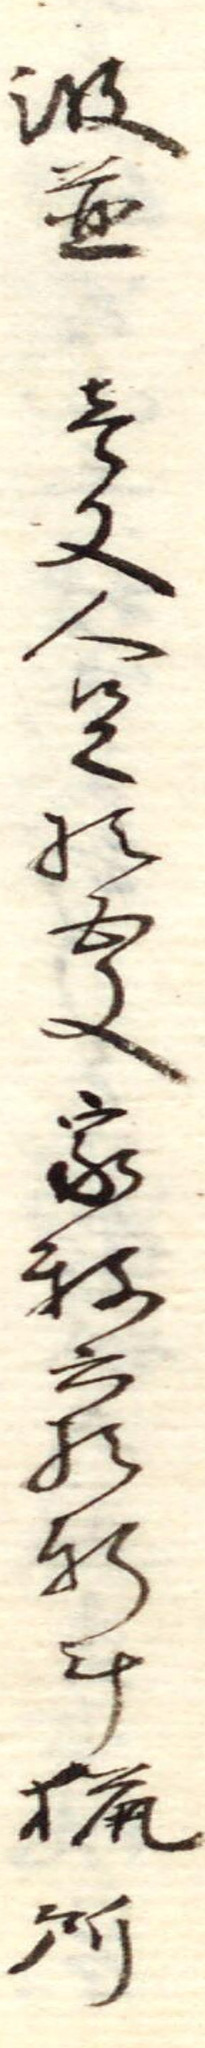波並壱文人足拾五文家数六拾軒斗猟所
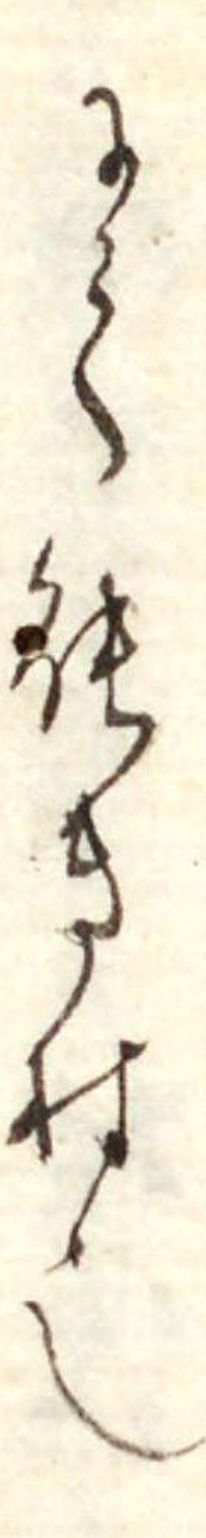にて能き村也
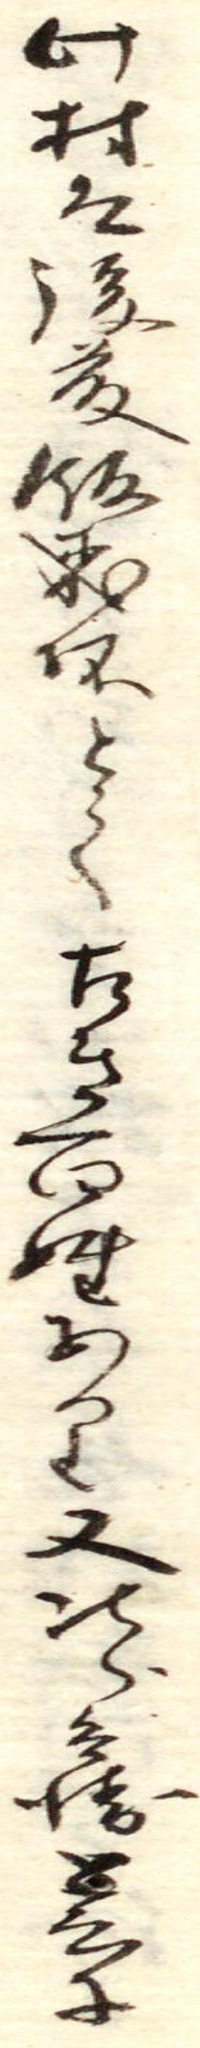此村は後藤飯盛抔とて古き百姓あり又次郎兵衛と言に
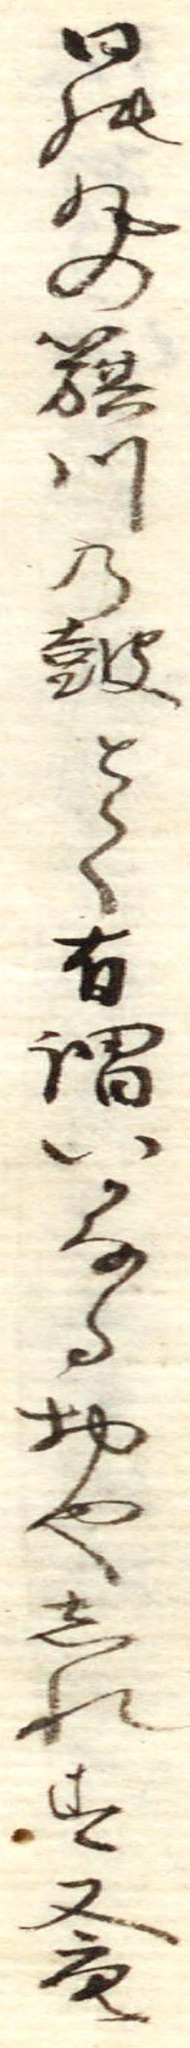日の丸の籏川の皷とて有謂いかなる物やしれす又唐
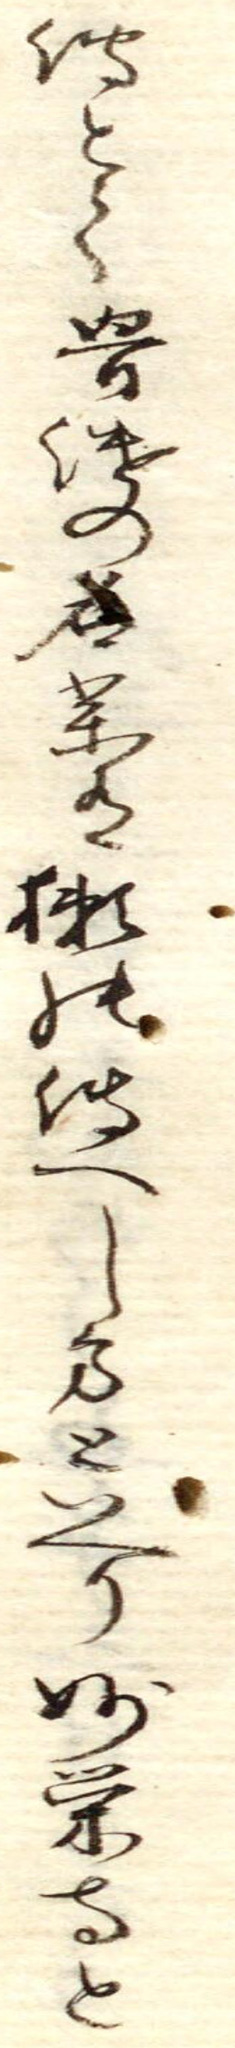伝とて骨継の名薬有獺の伝へし方といへり妙栄寺と
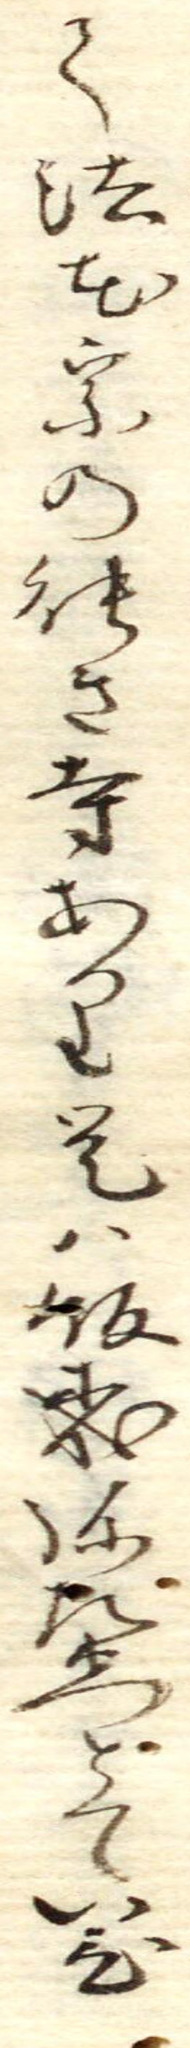て法花宗の能き寺あり是は飯盛弥左衛門とていひ

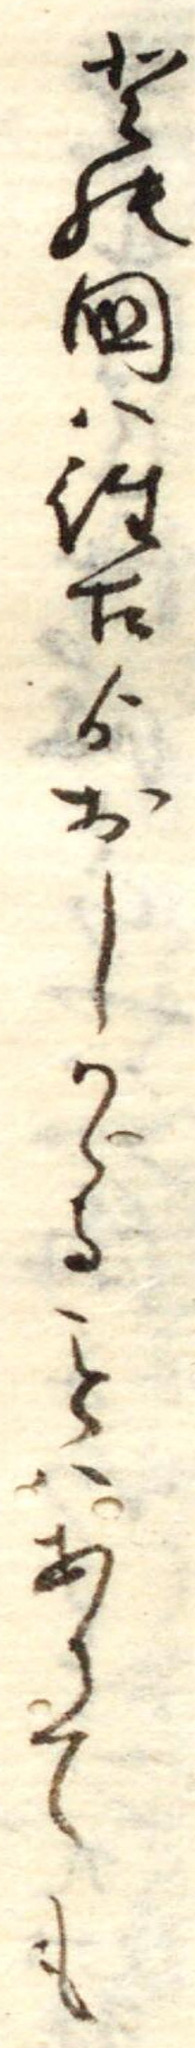登の国は往古ゟおしからることはありても
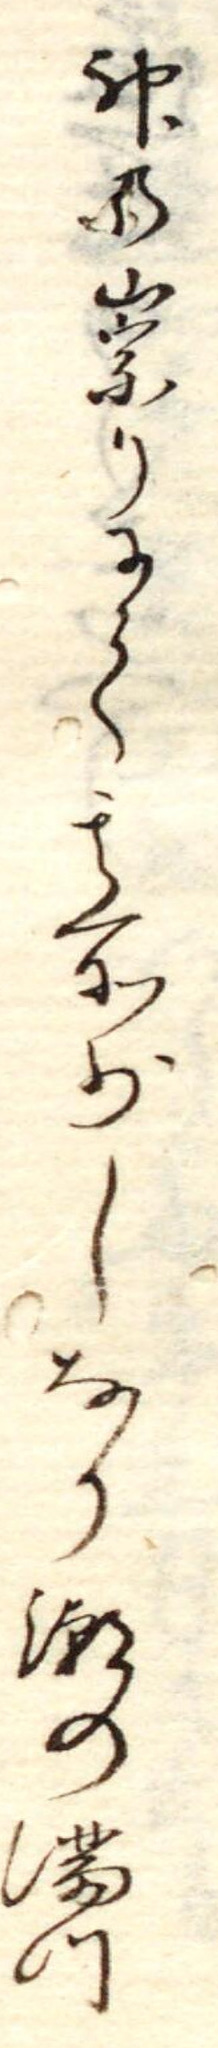神の祟りにて其所少しなり潮の満つ
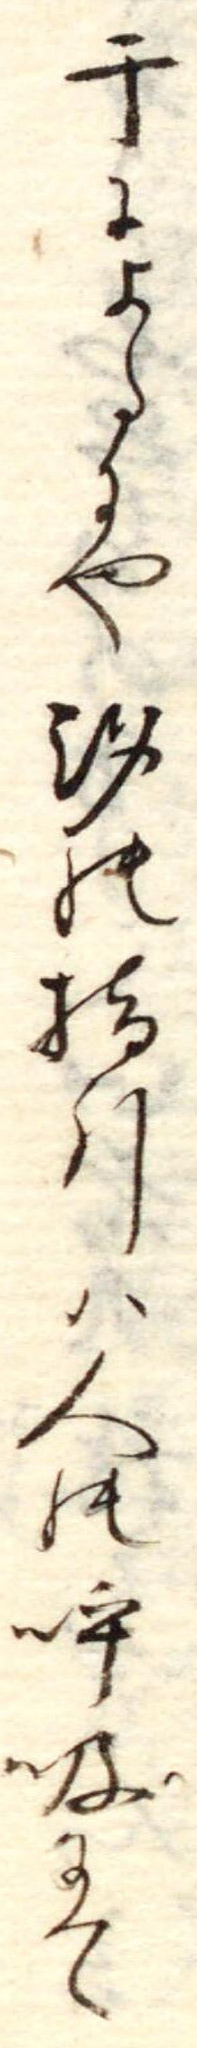干によるにや汐の指引は人の呼吸にて
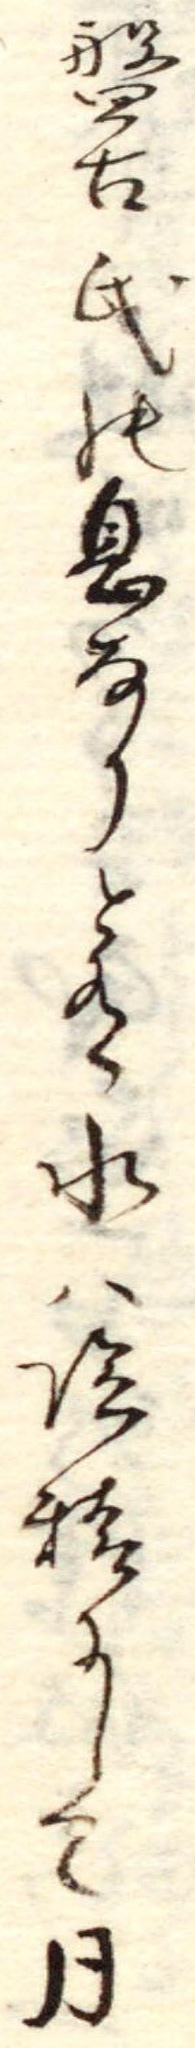盤古氏の息なりと有水は陰積にして月
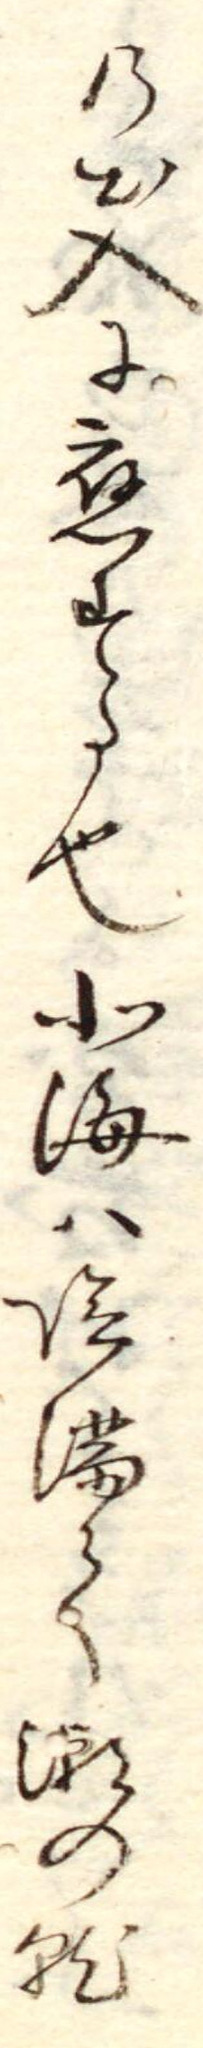の出入に応する也北海は陰満て潮の就
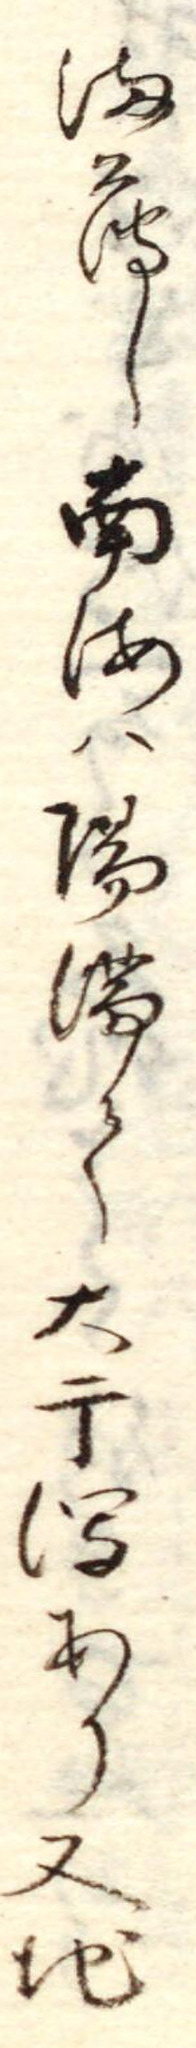満薄し南海は陽満て大干潟あり又地
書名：能登名跡誌
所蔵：Ishikawa Prefectural Library
